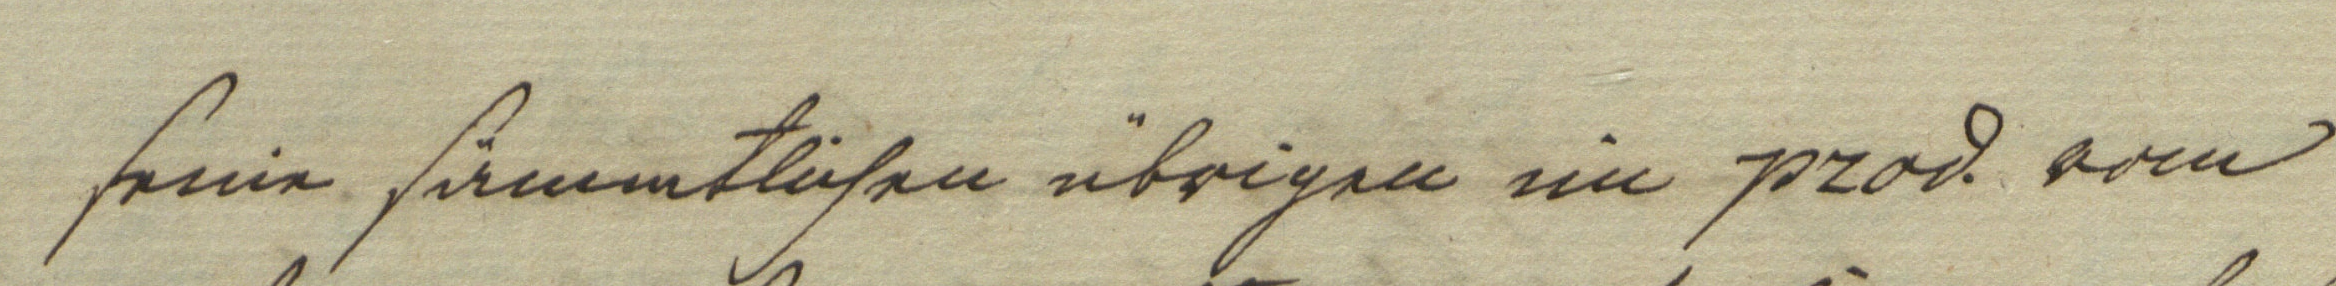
seine sämmtlichen übrigen im prod. vom
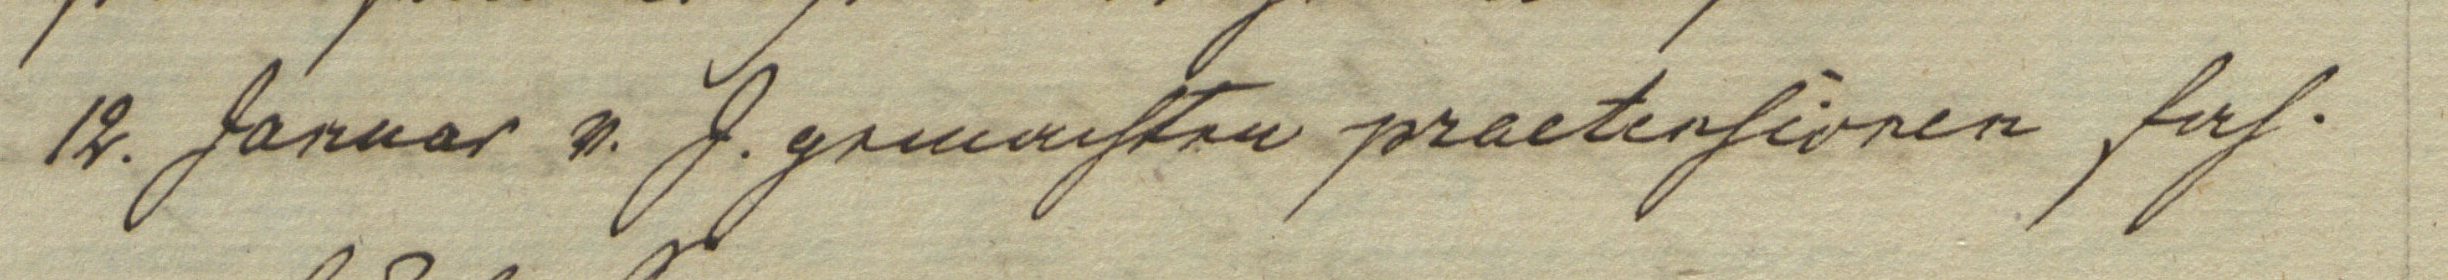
12. Januar v. J. gemachten praetensionen fah¬
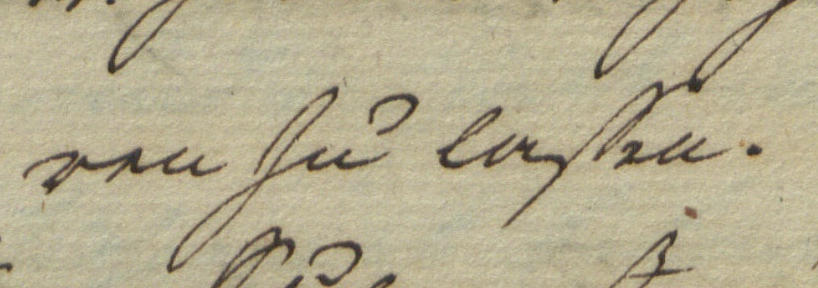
ren zu lassen.
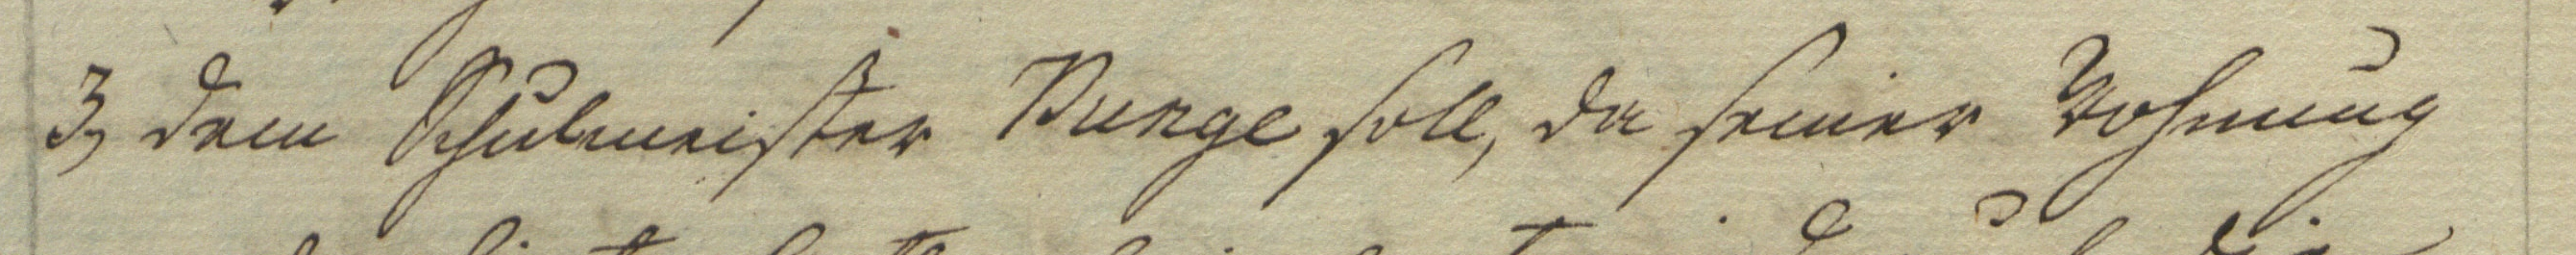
3, dem Schulmeister Bunge soll, da seiner Wohnung
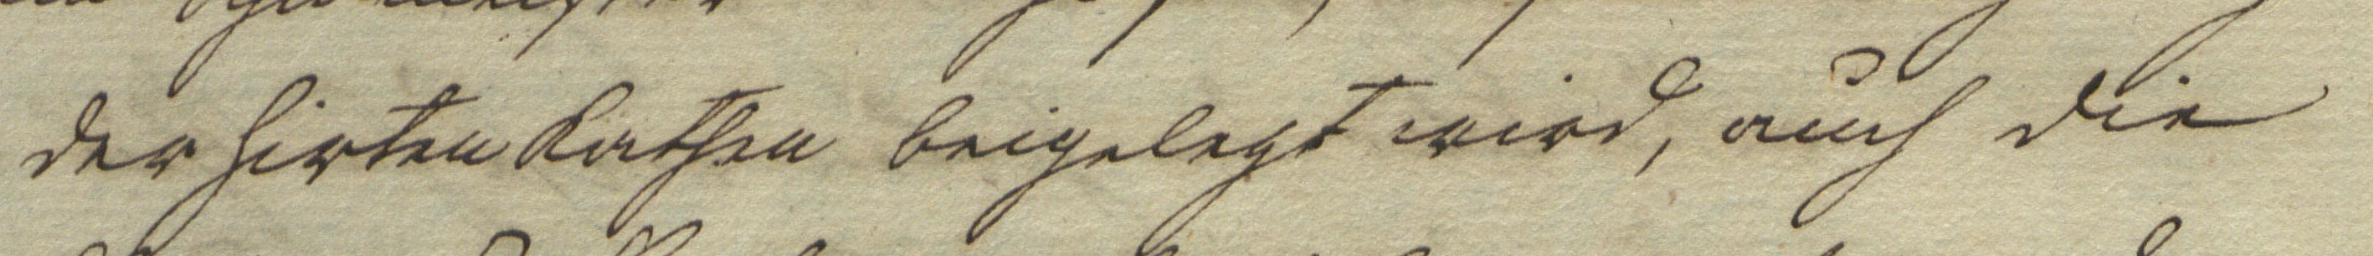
der HirtenKathen beigelegt wird, auch die
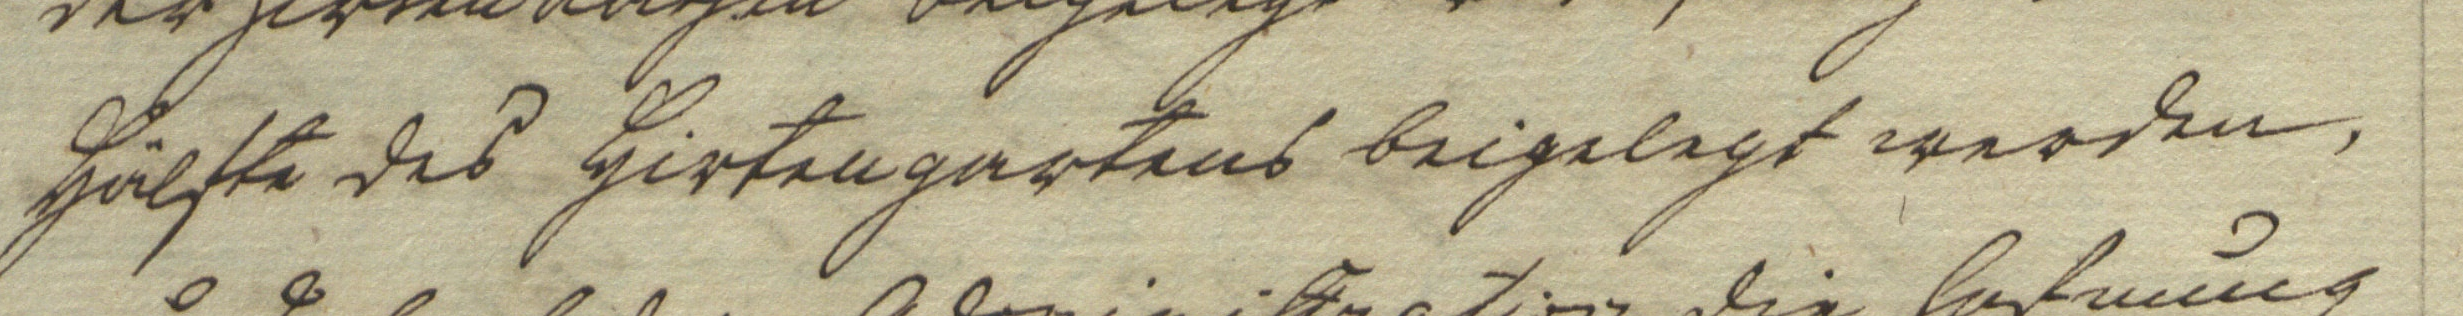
Hälfte des Hirtengartens beigelegt werden,
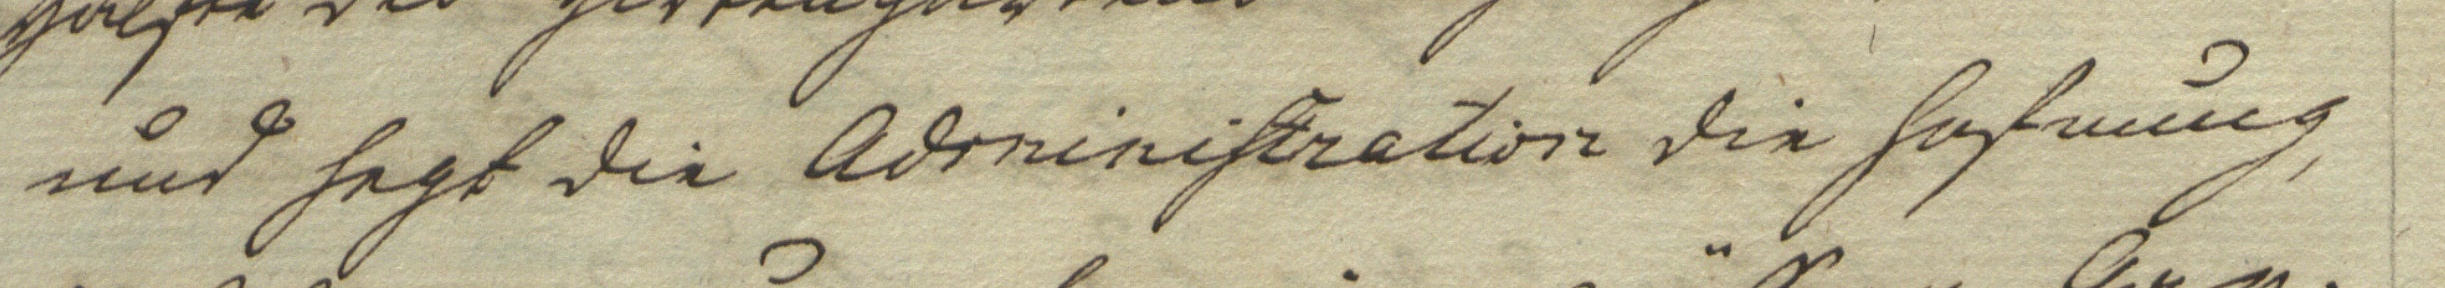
und hegt die Administration die Hofnung,
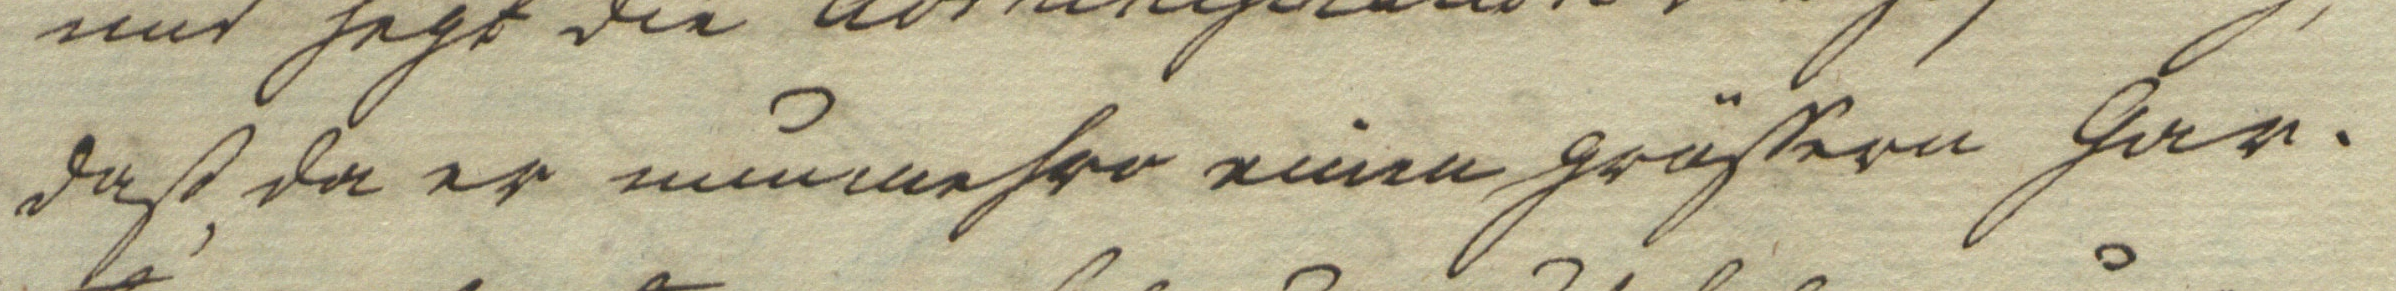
daß da er nunmehro einen grössern Gar¬
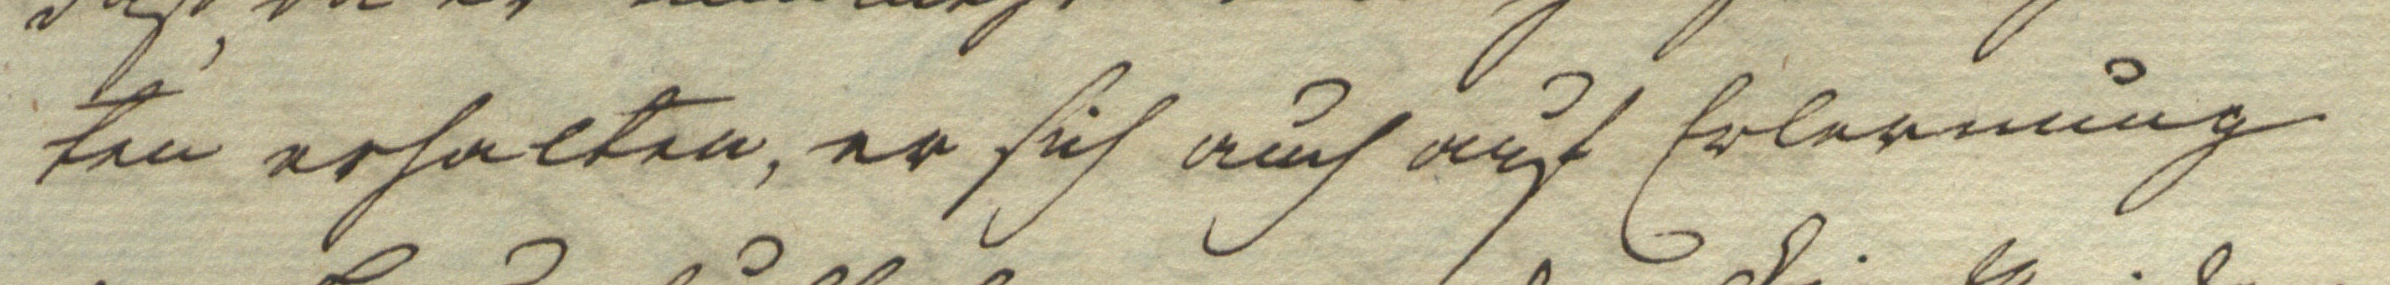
ten erhalten, er sich auch auf Erlernung
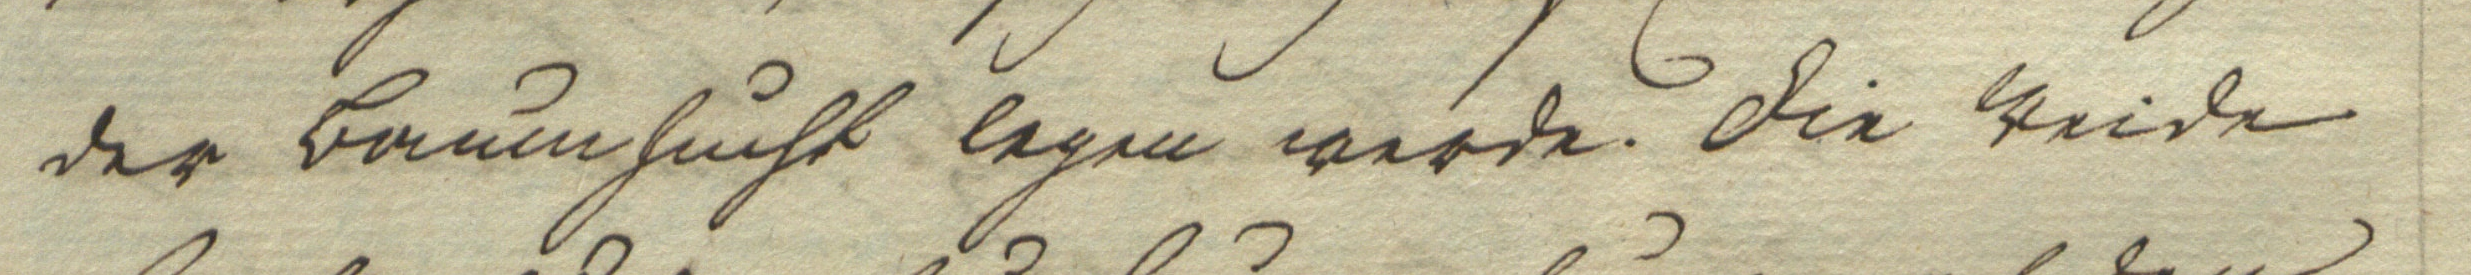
der Baumzucht legen werde. Die Weide
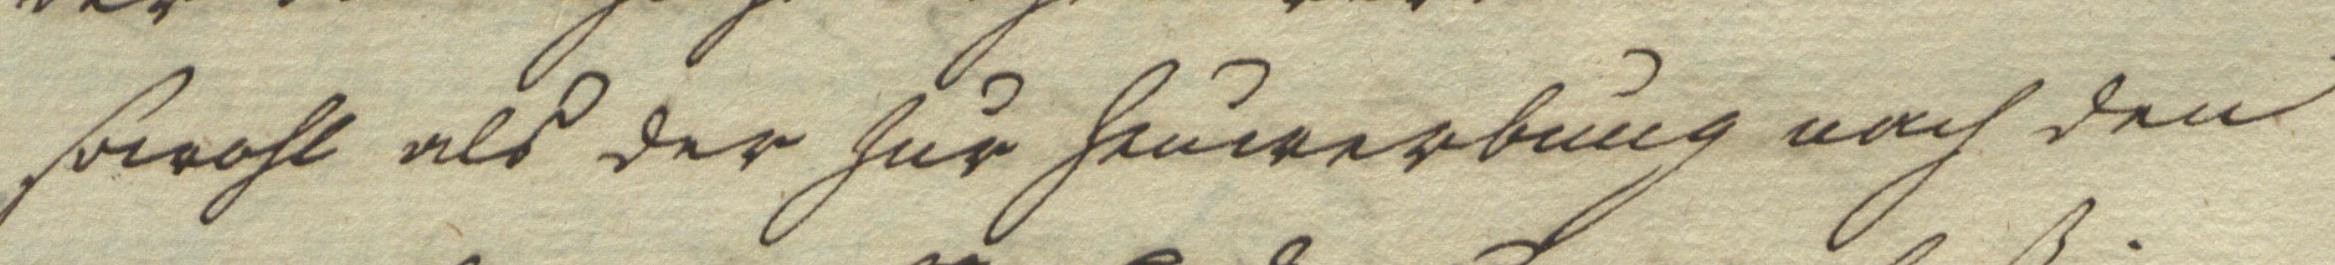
sowohl als der zur Heuwerbung nach den
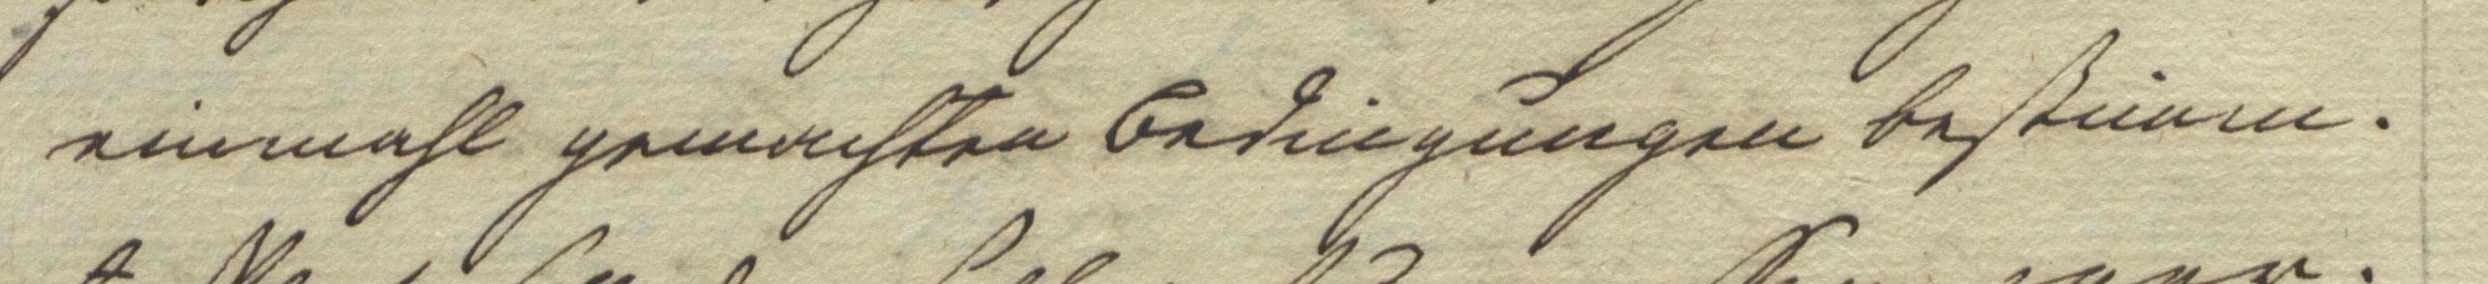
einmahl gemachten Bedingungen bestimm¬
